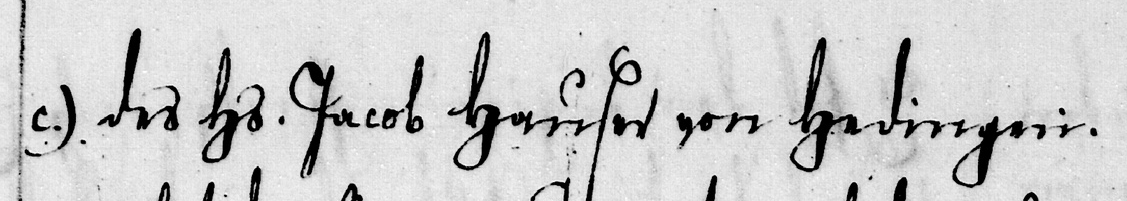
c.) des Hs. Jacob Hauser von Hedingen.
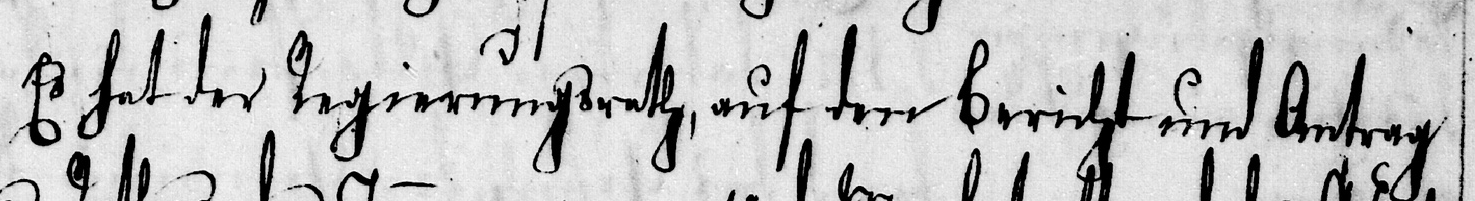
Es hat der Regierungsrath, auf den Bericht und Antrag
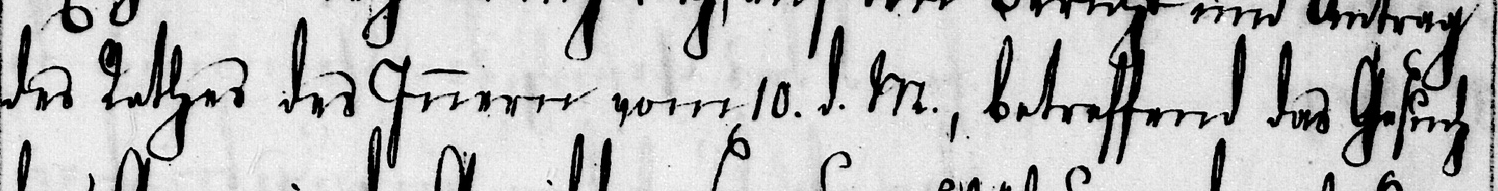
des Rathes des Innern vom 10. d. M., betreffend das Gesuch
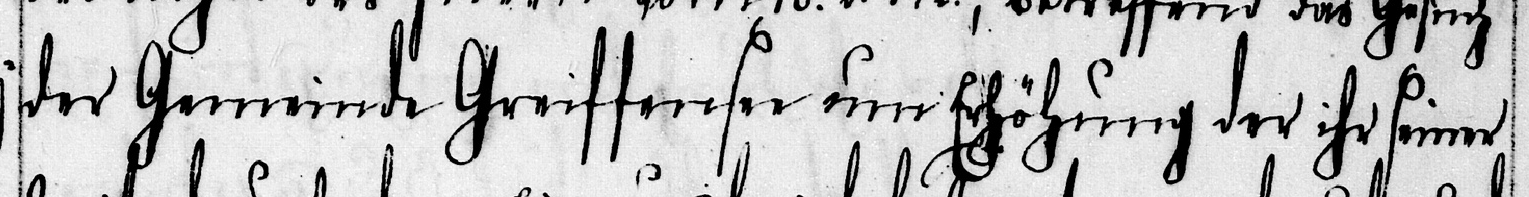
der Gemeinde Greiffensee um Erhöhung der ihr sein¬
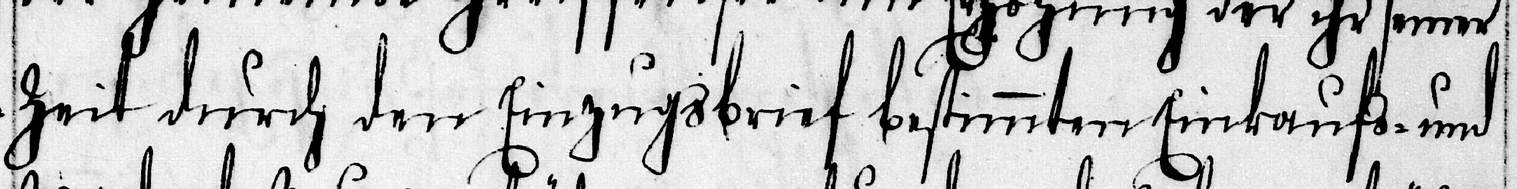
Zeit durch den Einzugsbrief bestimmten Einkaufs- und
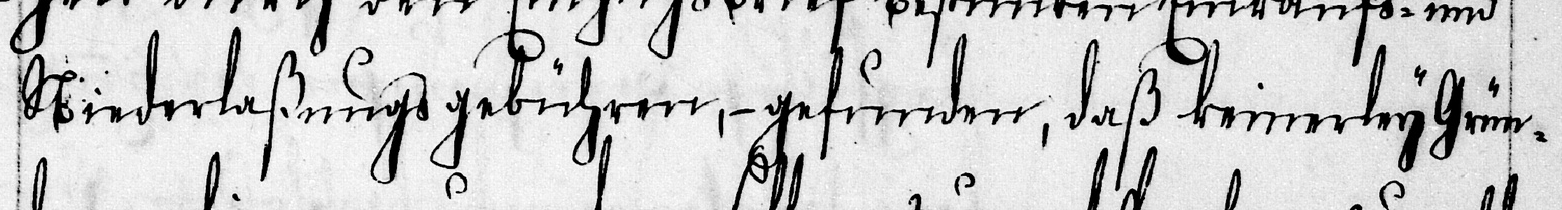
Niederlaßungsgebühren, – gefunden, daß keinerley Grün¬
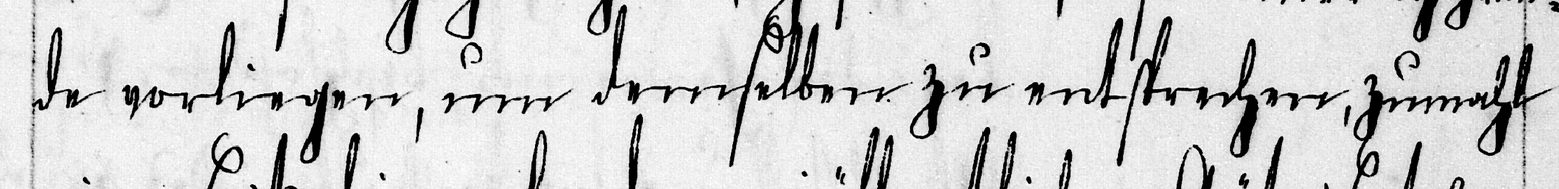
de vorliegen, um demselben zu entsprechen, zumahl
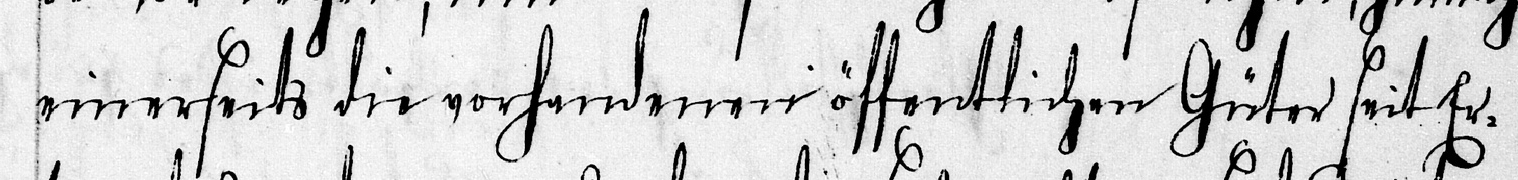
einerseits die vorhandenen öffentlichen Güter seit Er¬
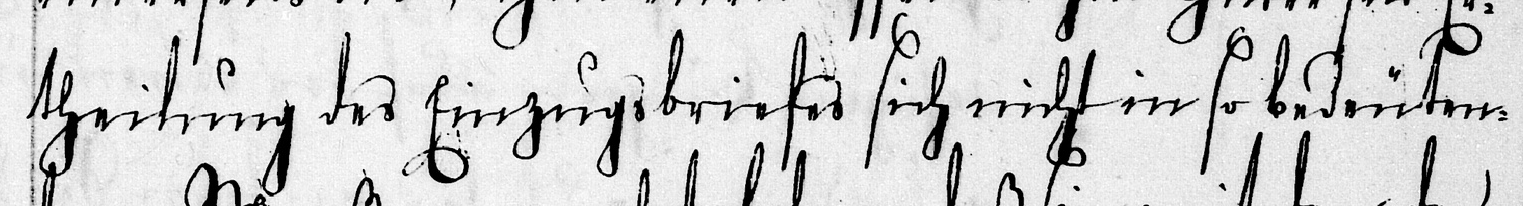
theilung des Einzugsbriefes sich nicht in so bedeuten¬
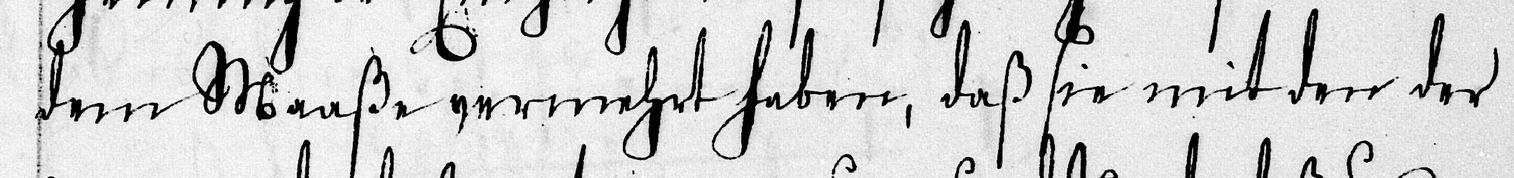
dem Maaße vermehrt haben, daß sie mit den der
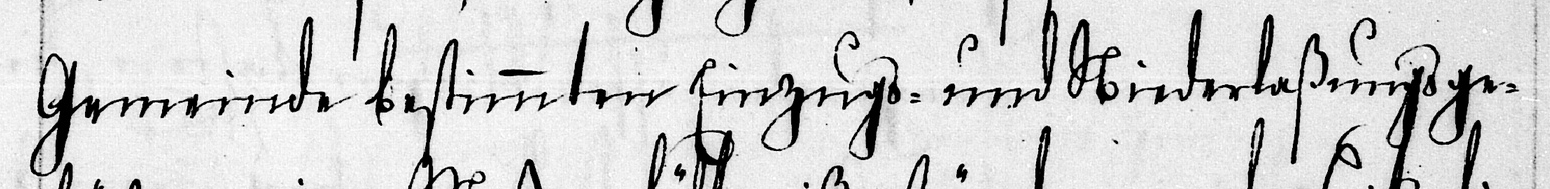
Gemeinde bestimmten Einzugs- und Niederlaßungsge¬
